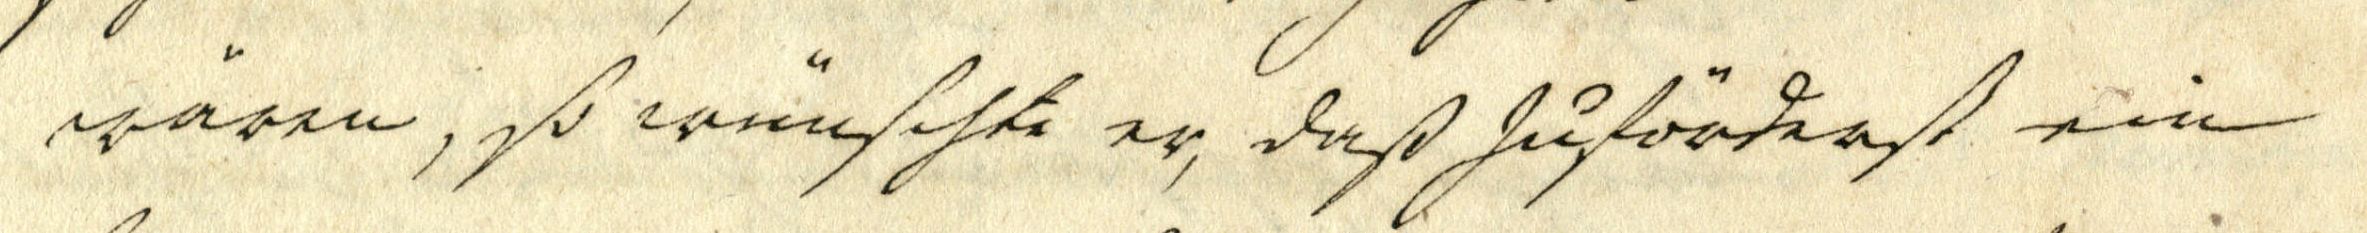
wären, so wünschte er, daß zuförderst ein
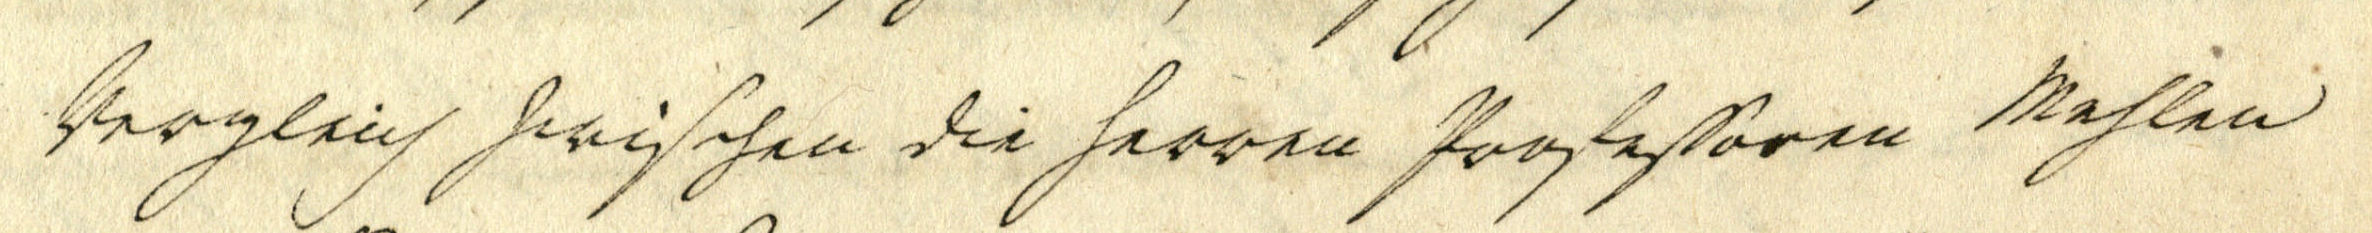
Vergleich zwischen die herren Professoren Mehlen
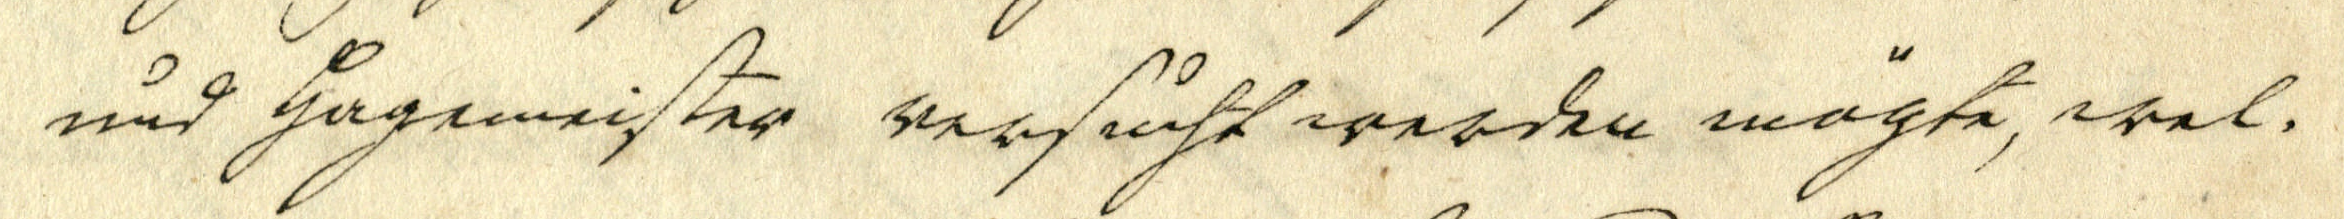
und Hagemeister versucht werden mögte, wel¬
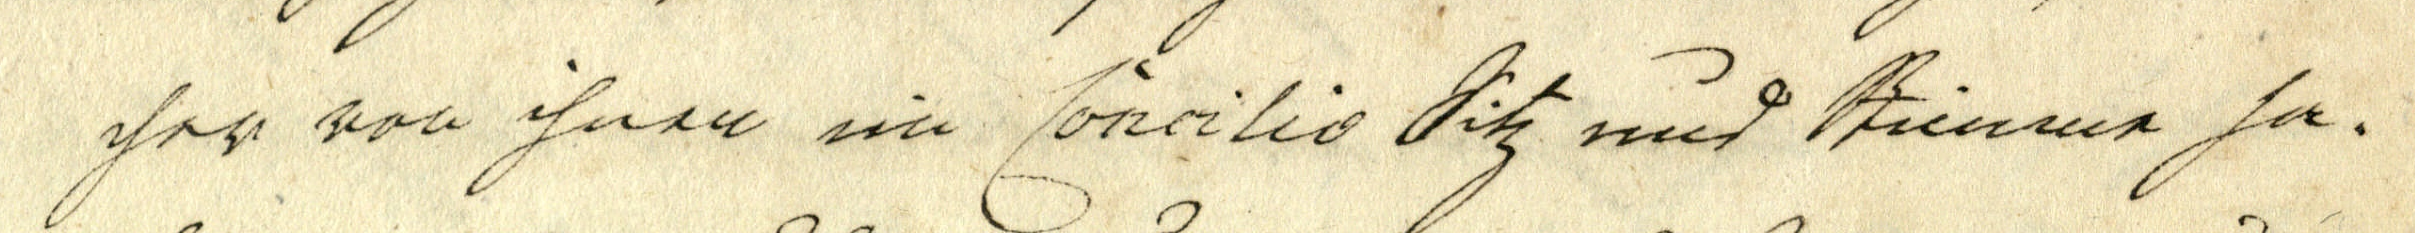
cher von ihnen im Concilio Sitz und Stimme ha¬
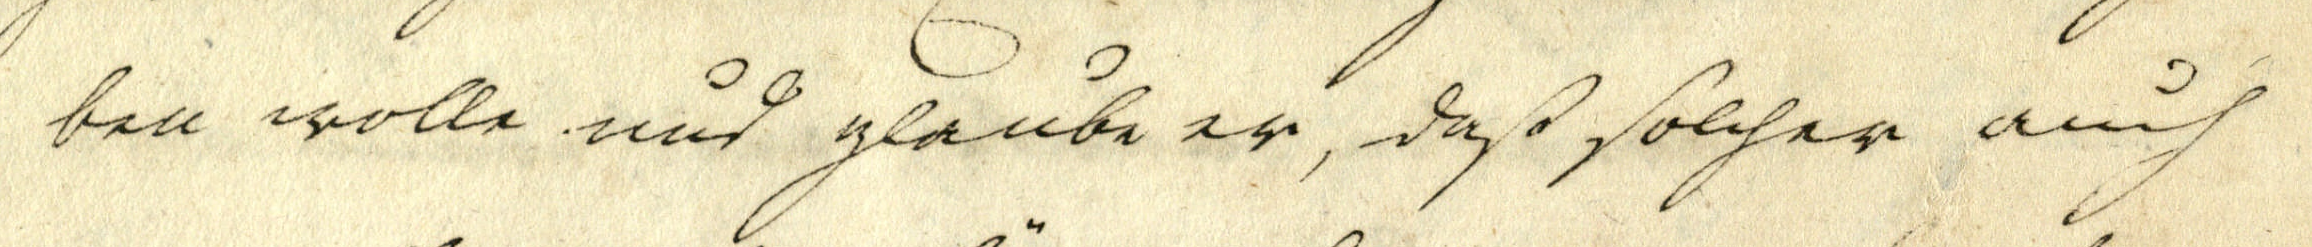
ben wolle und glaube er, daß solcher auch
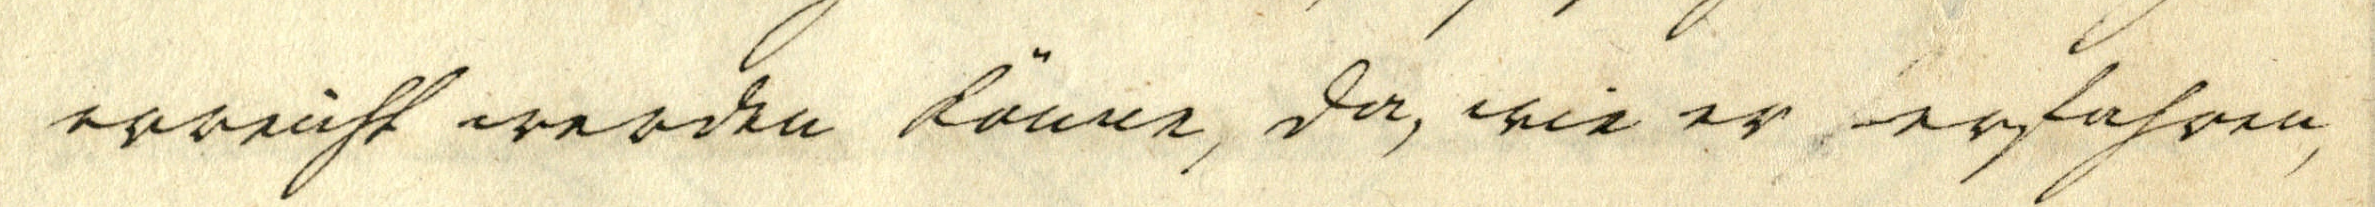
erreicht werden könne, da, wie er erfahren,
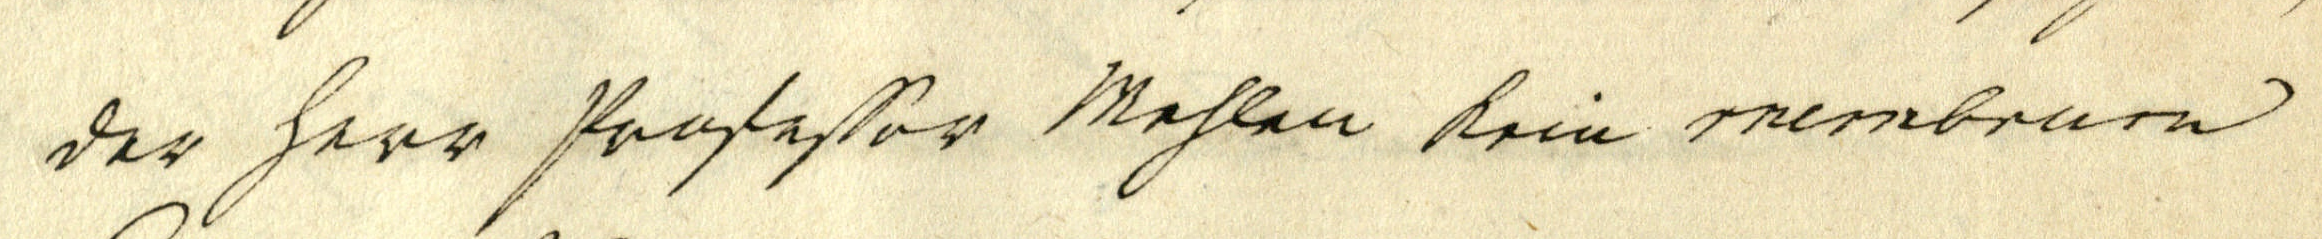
der herr Professor Mehlen kein membrum
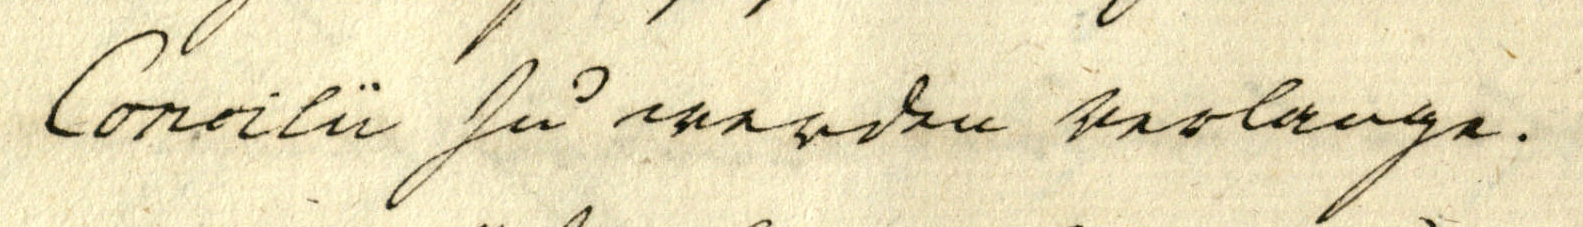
Concilii zu werden verlange.
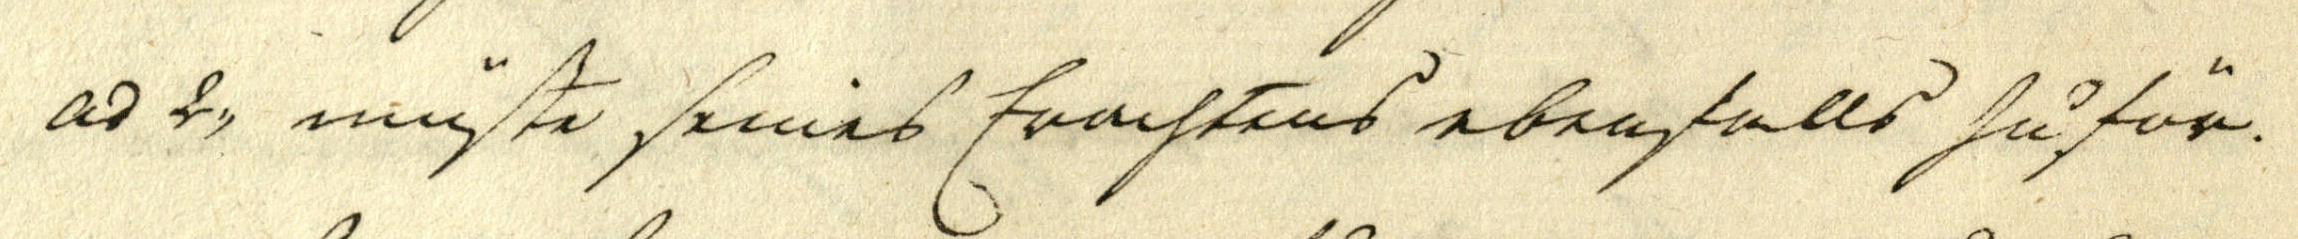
ad 2., müste seines Erachtens ebenfalls zuför¬
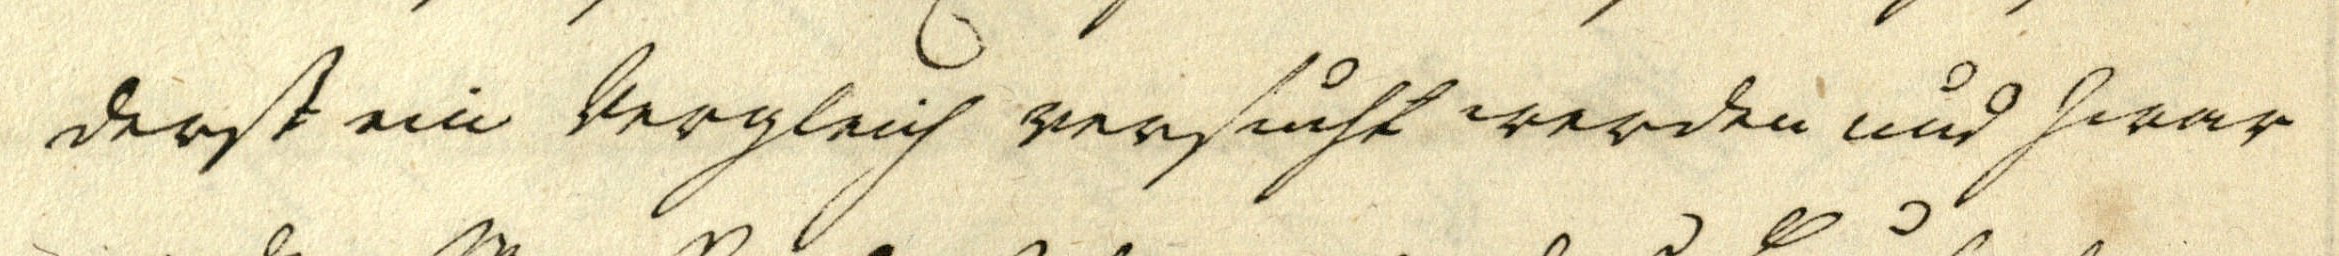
derst ein Vergleich versucht werden und zwar
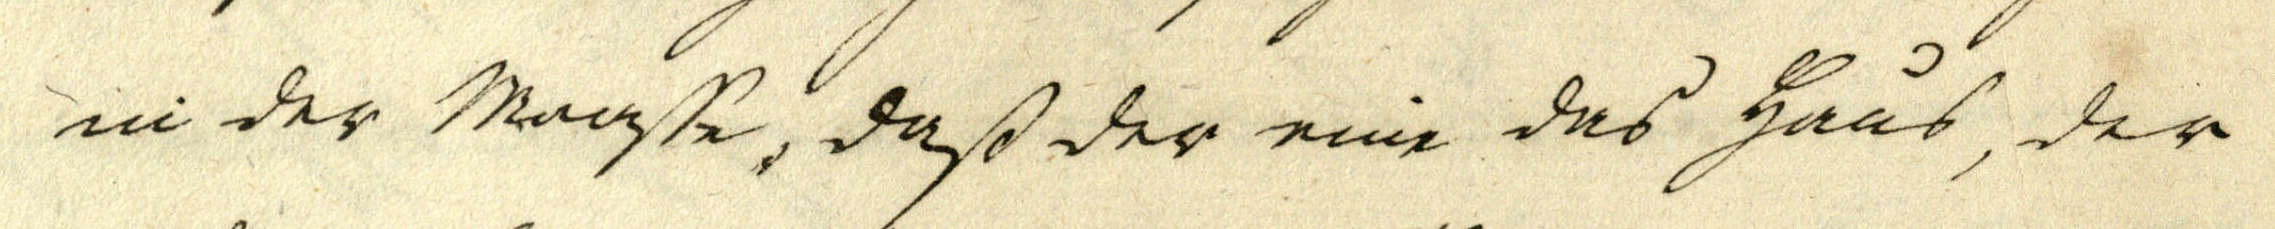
in der Maasse, daß der eine das Haus, der
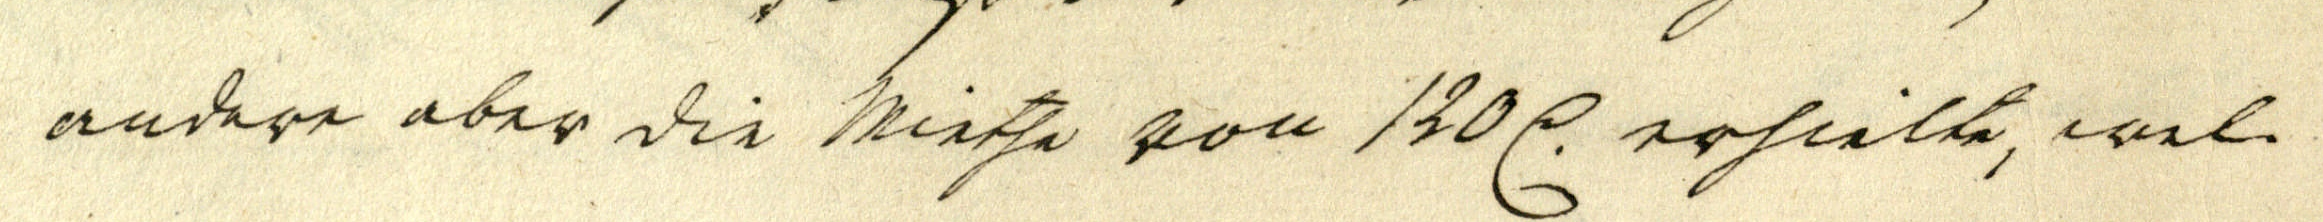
andere aber die Miethe von 120 l. erhielte, wel¬
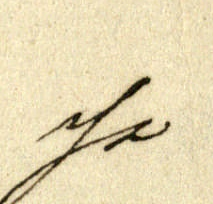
che
